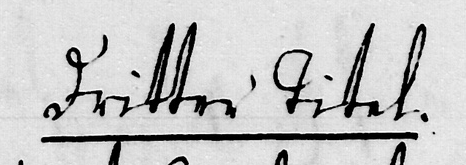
Dritter Titel.
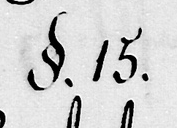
§. 15.
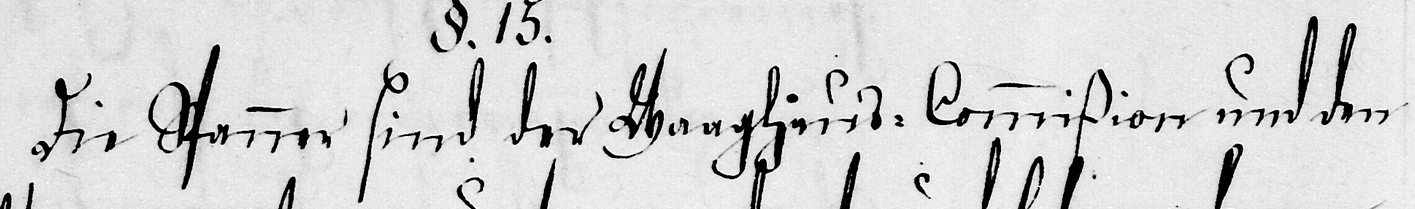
Die Spanner sind der Waaghaus-Commißion und den
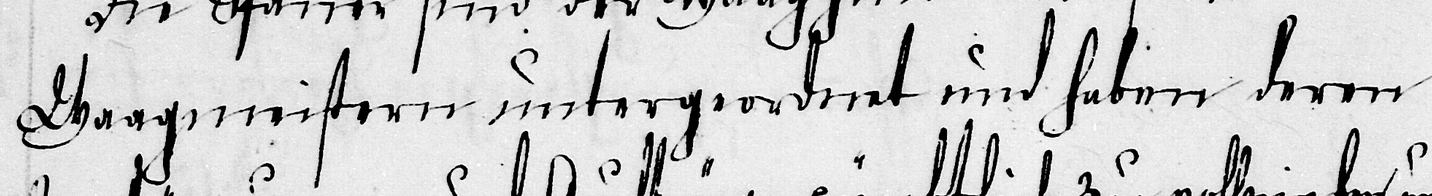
Waagmeistern untergeordnet und haben deren
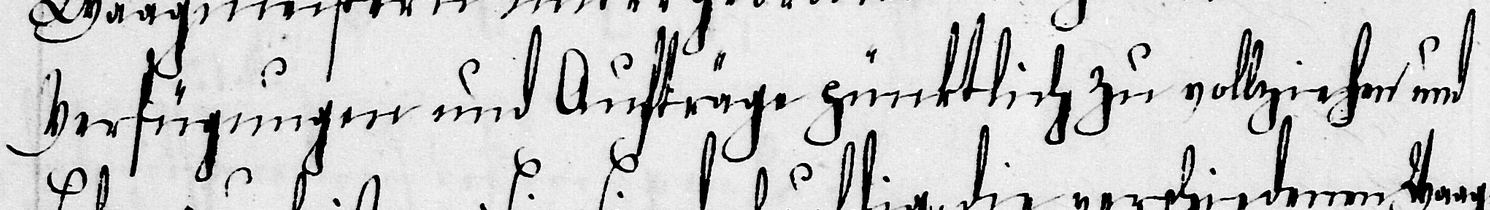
Verfügungen und Aufträge pünktlich zu vollziehen
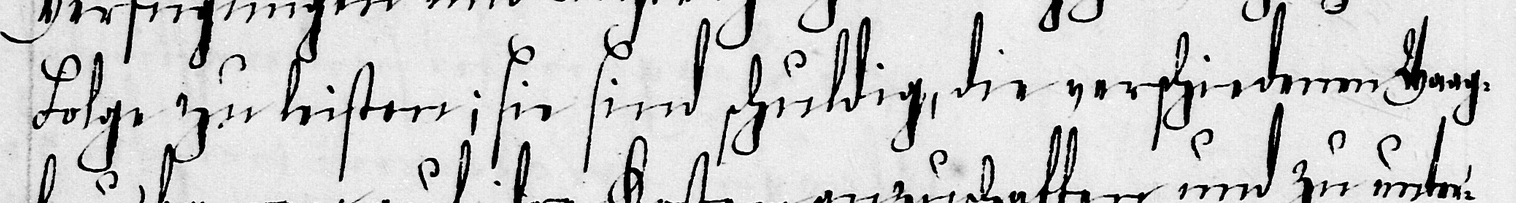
Folge zu leisten; sie sind schuldig, die verschiedenen Waag¬
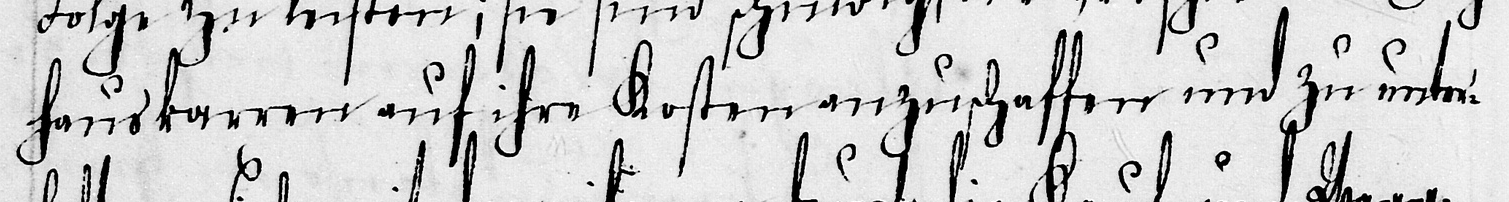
hauskarren auf ihre Kosten anzuschaffen und zu unter¬
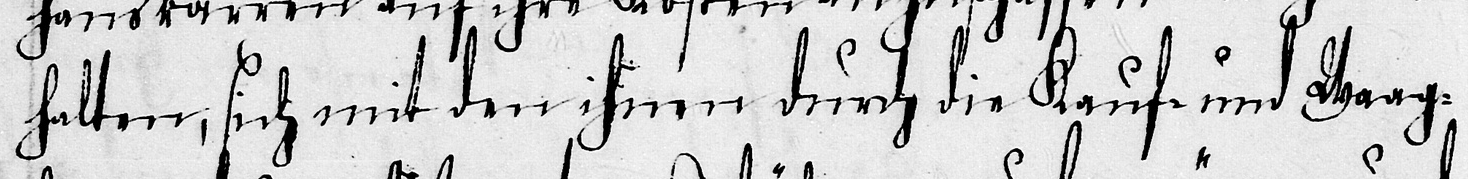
halten, sich mit den ihnen durch die Kauf- und Waag¬
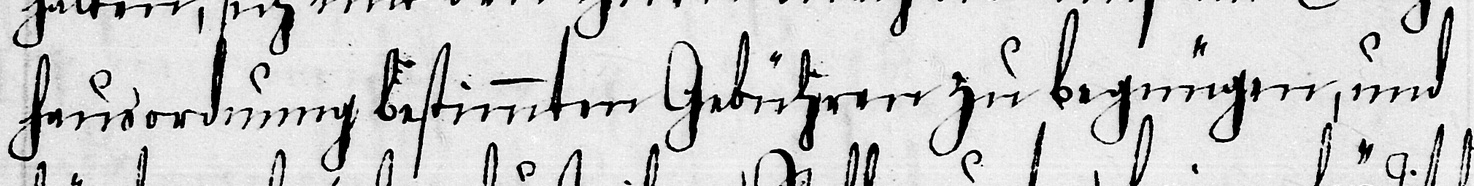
hausordnung bestimmten Gebühren zu begnügen, und
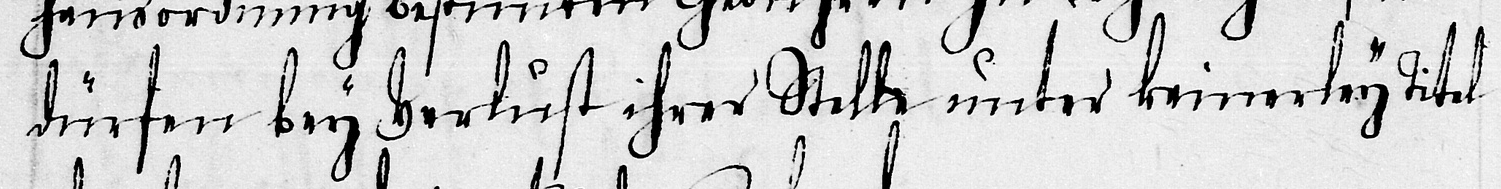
dürfen bey Verlust ihrer Stelle unter keinerley Titel
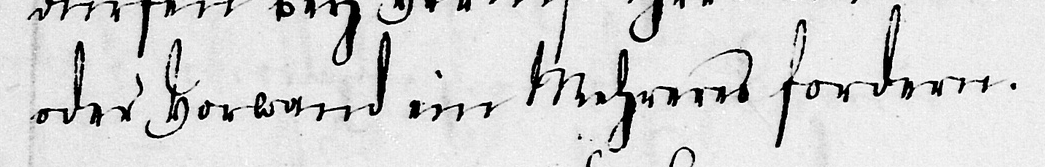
oder Vorwand ein Mehreres fordern.
